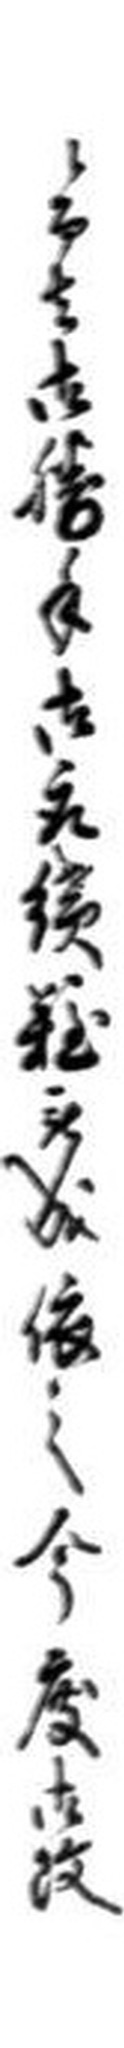候而者御勝手取続難被成依之今度御改
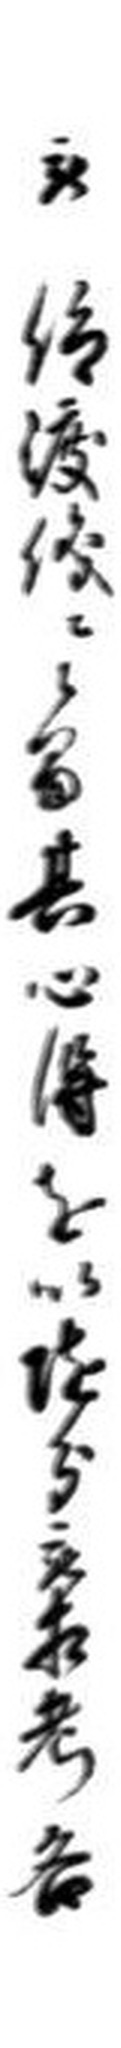被仰渡儀ニ候間其心得を以随分被相考各
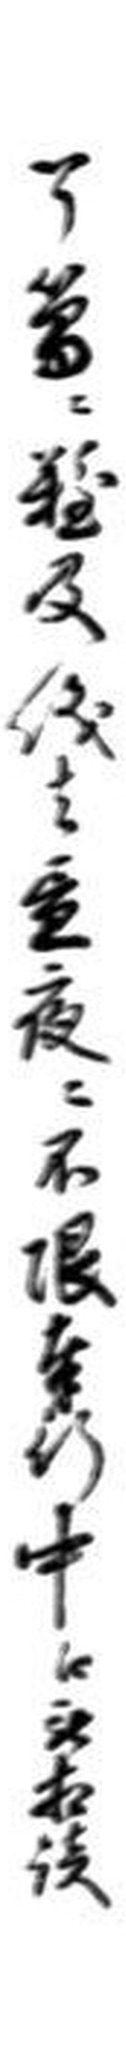了簡ニ難及儀者昼夜ニ不限奉行中江被相談
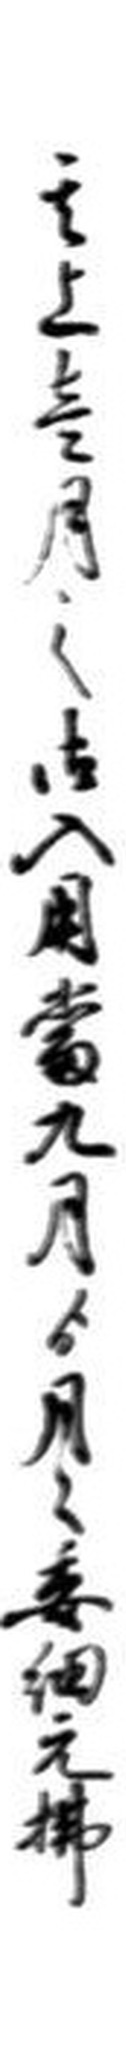其上壱月之御入用当九月ゟ月々委細元払
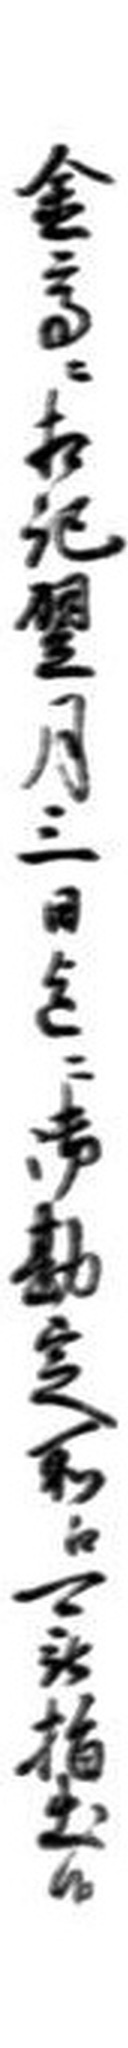金高ニ相記翌月三日迄ニ御勘定所江可被指出候
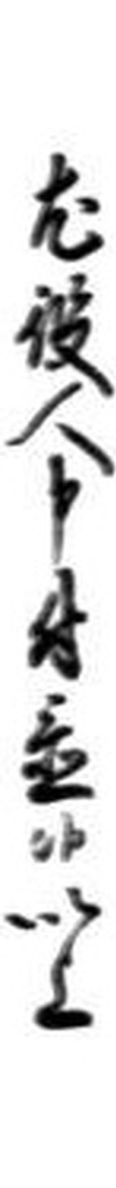尤役人申付置候以上
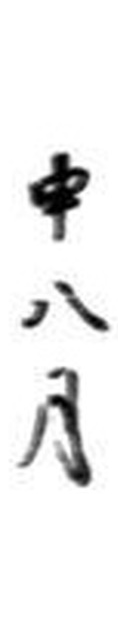申八月
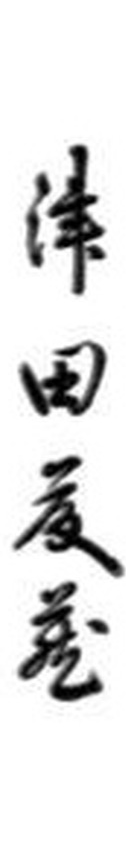津田藤蔵
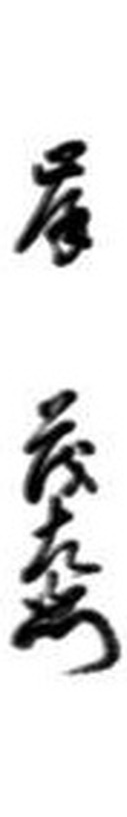岸茂左衛門

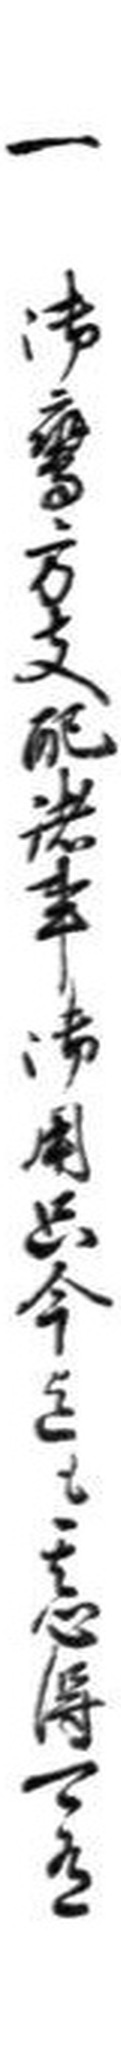一御鷹方支配諸事御用只今迄も其心得可有
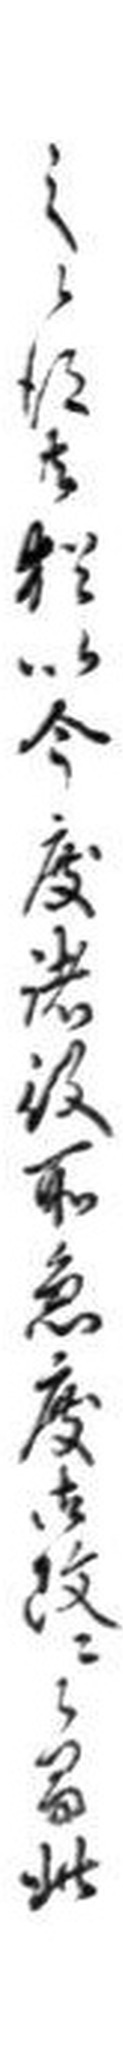之候得共猶以今度諸役所急度御改ニ候間此
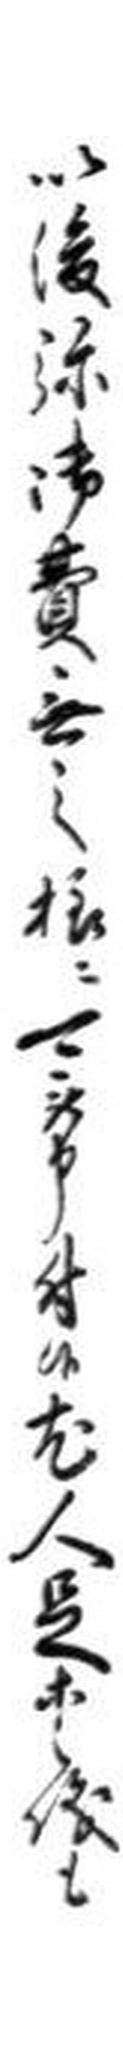以後弥御費無之様ニ可被申付候尤人足等之儀も
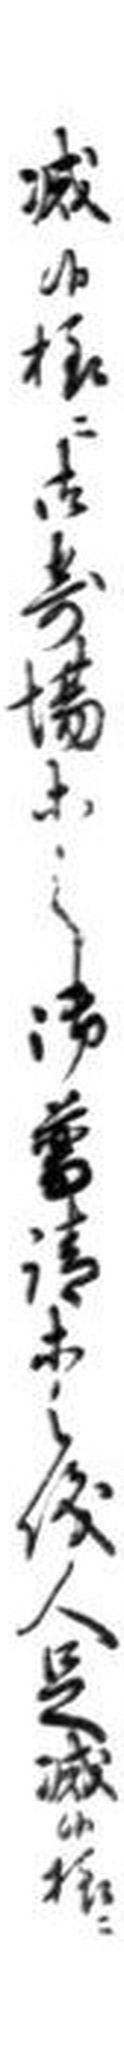減候様ニ御寄場等之御普請等之儀人足減候様ニ
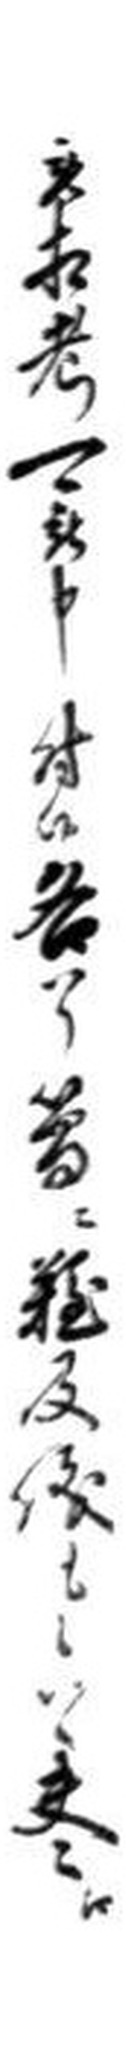被相考可被申付候各了簡ニ難及儀も候ハヽ夫々江
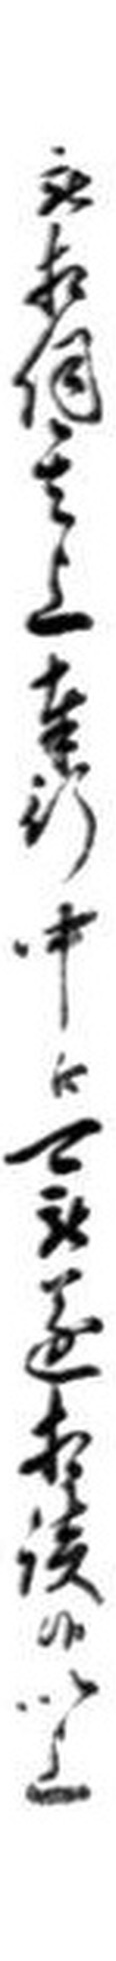被相伺其上奉行中江可被遂相談候以上
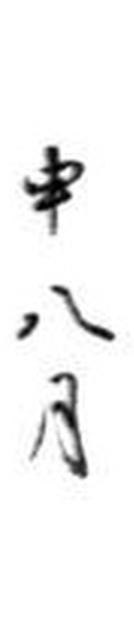申八月
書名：家譜 三十一 吉邦公 享保元年
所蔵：福井県文書館 Fukui Prefectural Archives
